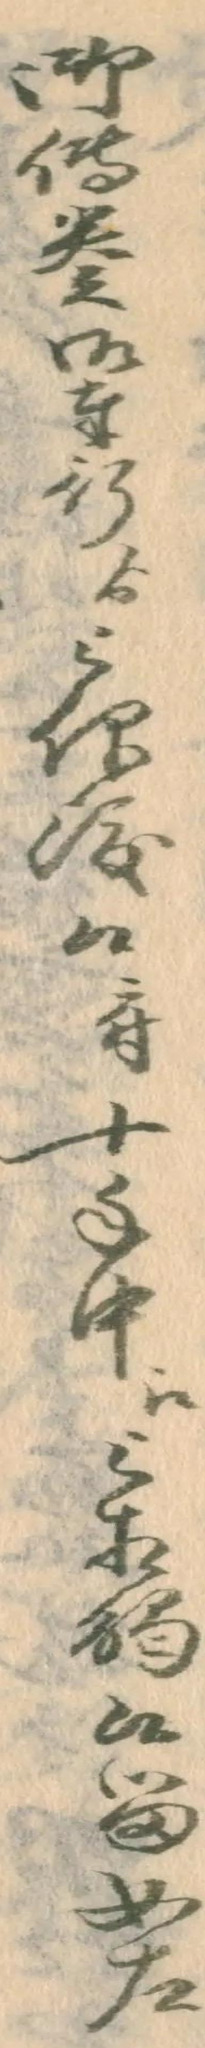御伝奏御奉行ゟ被仰渡候ニ付十手中江被相触候留如左
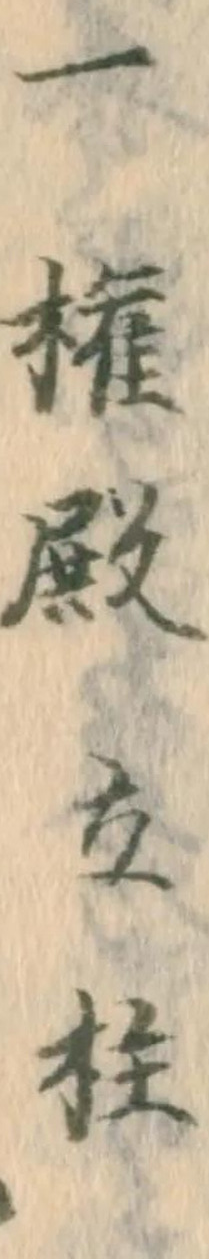一権殿立柱
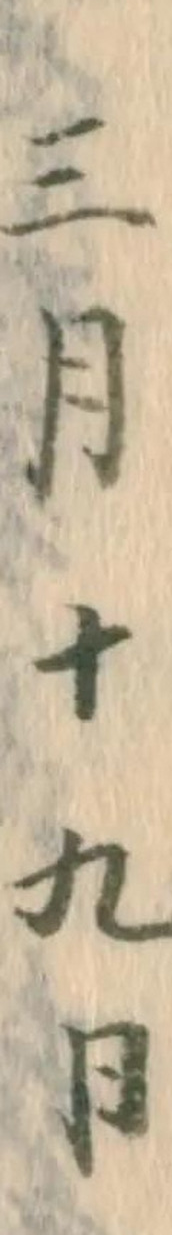三月十九日
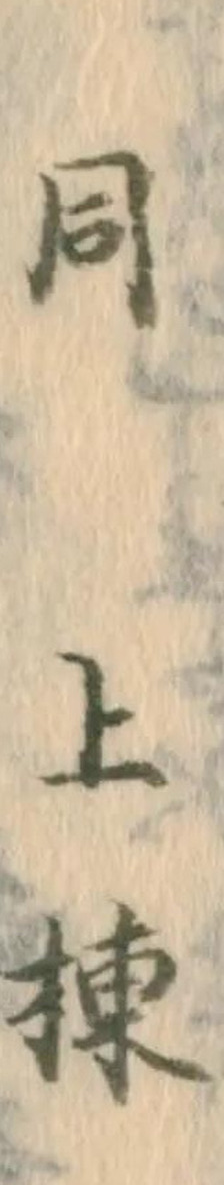同上棟
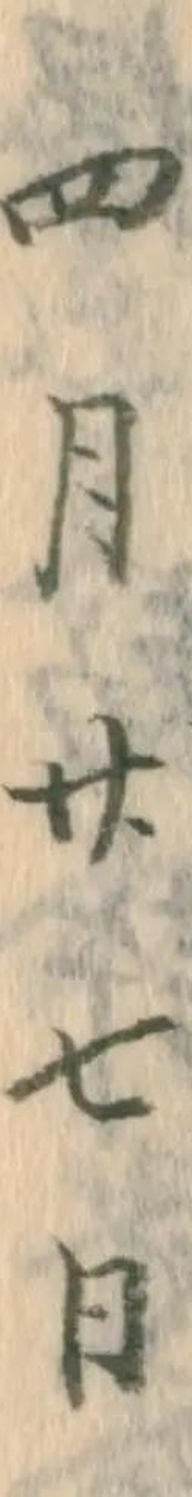四月廿七日
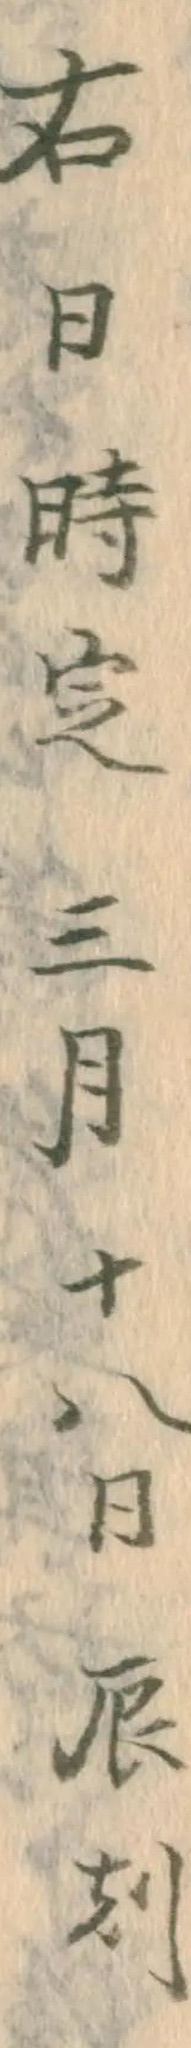右日時定三月十八日辰刻
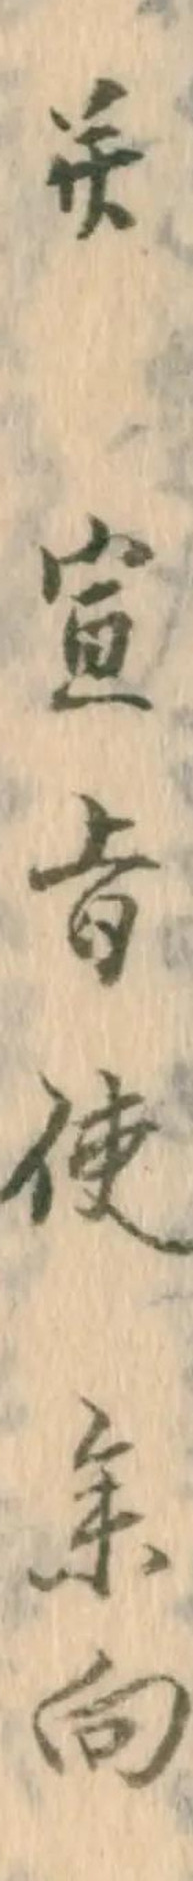并宣旨使参向
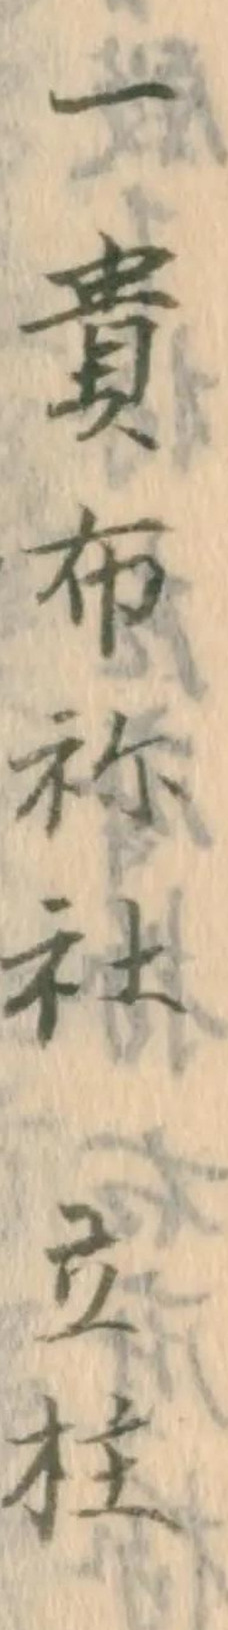一貴布祢社立柱
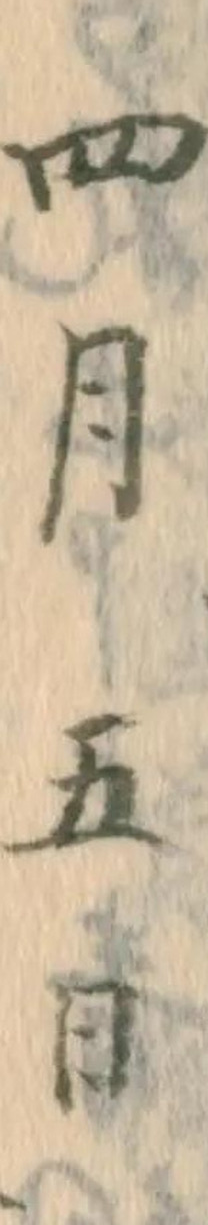四月五日
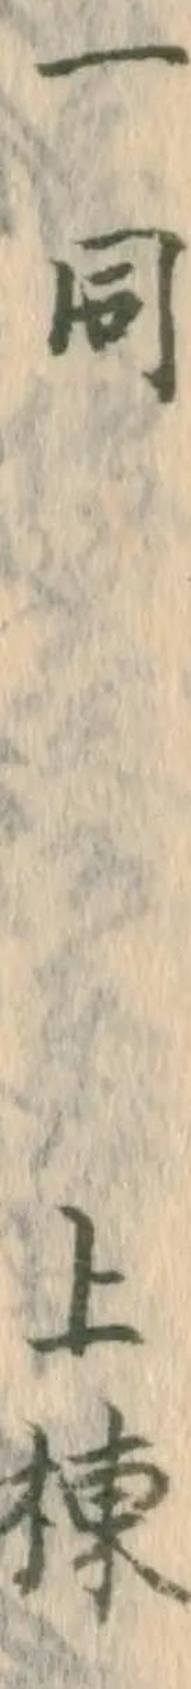一同上棟
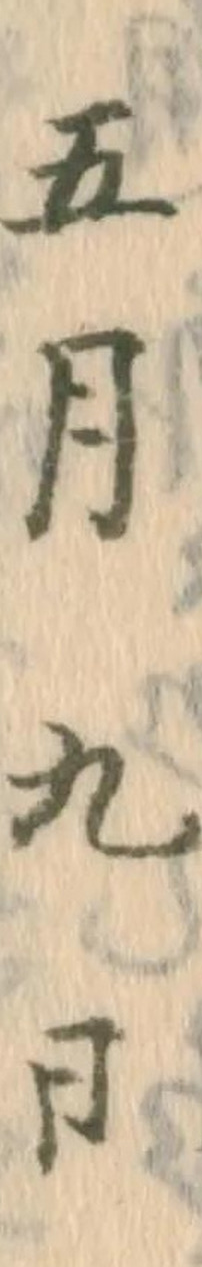五月九日
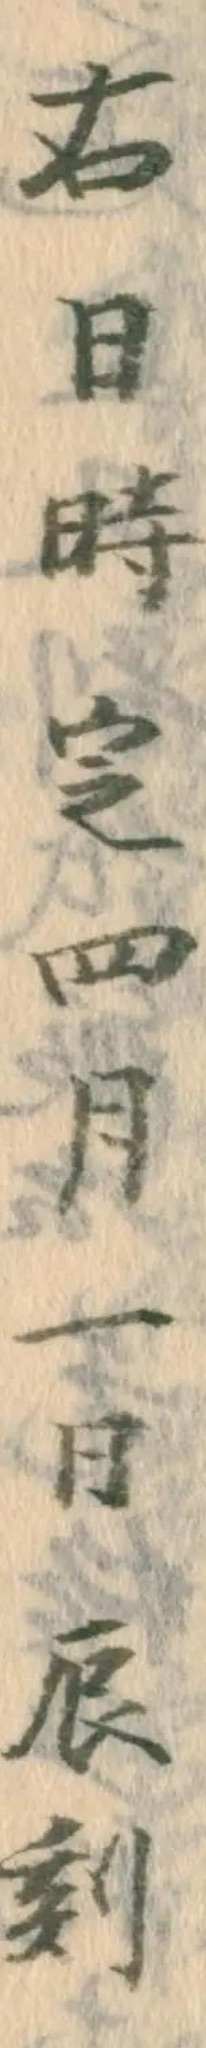右日時定四月一日巳刻
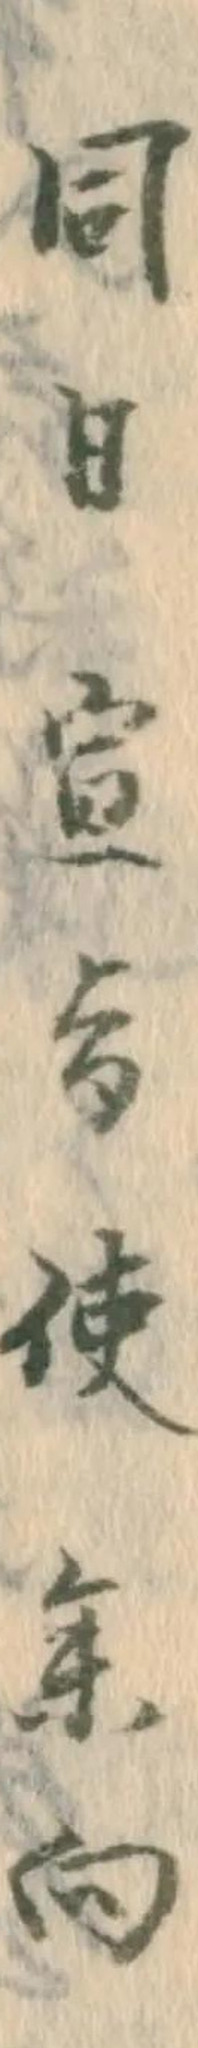同日宣旨使参向
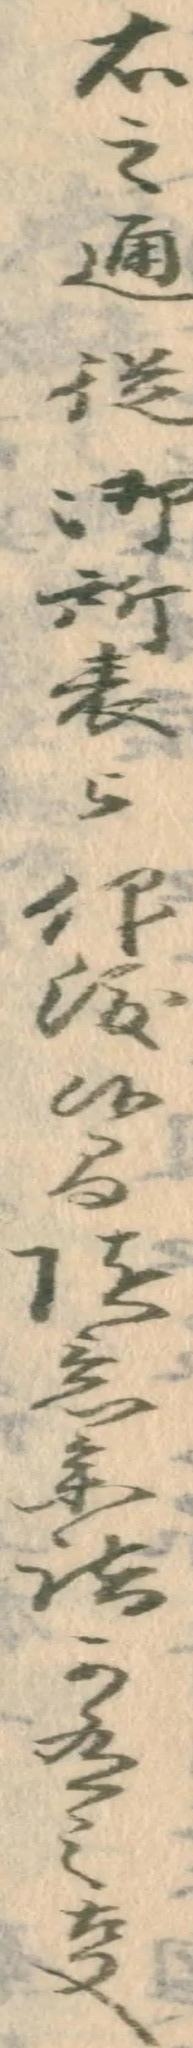右之通従御所表被仰渡候間随意参詣可有之事
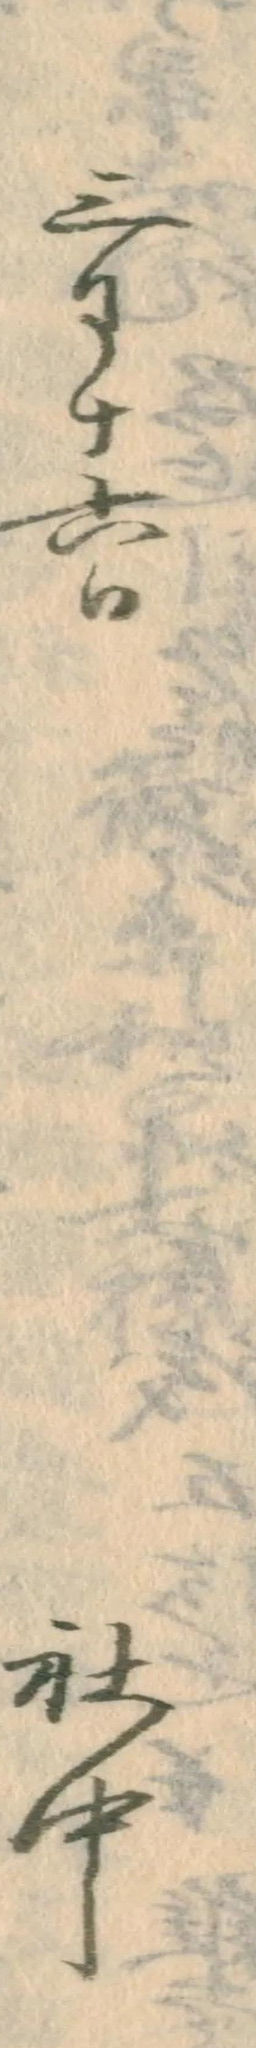三月十六日社中
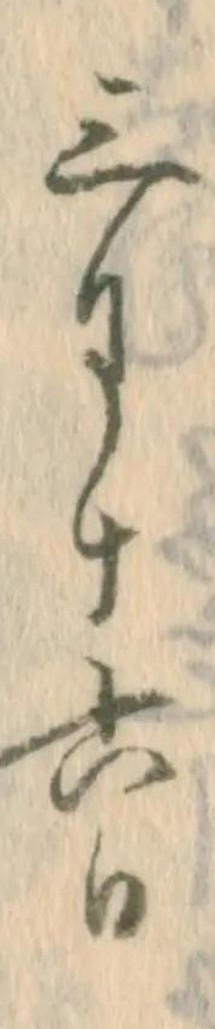三月十九日
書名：賀茂社記録. 第17冊
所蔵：国立国会図書館 National Diet Library, JAPAN
